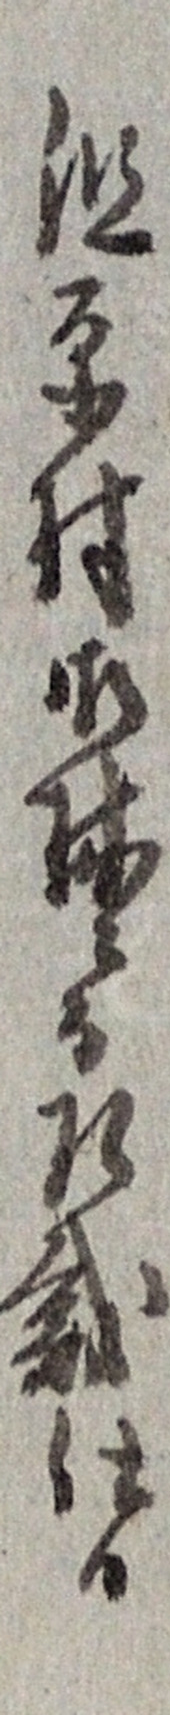但原村御林ニ而頂戴仕候
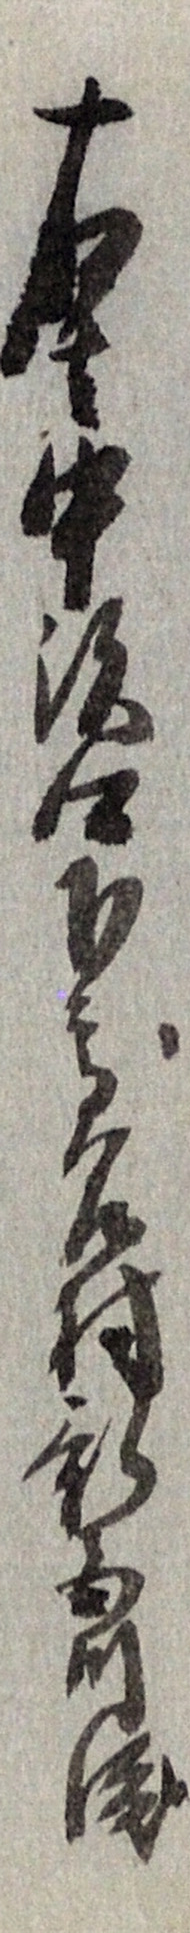右者中沢郷下高見村新宮川渡
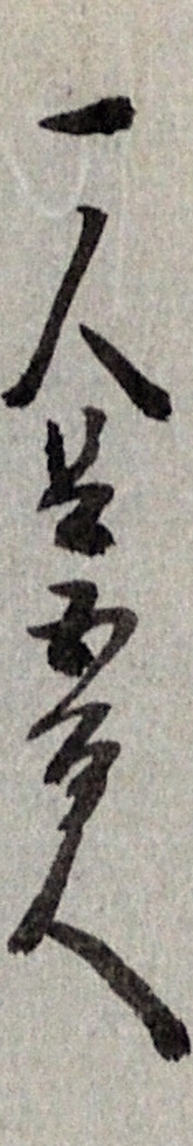一人足五百人
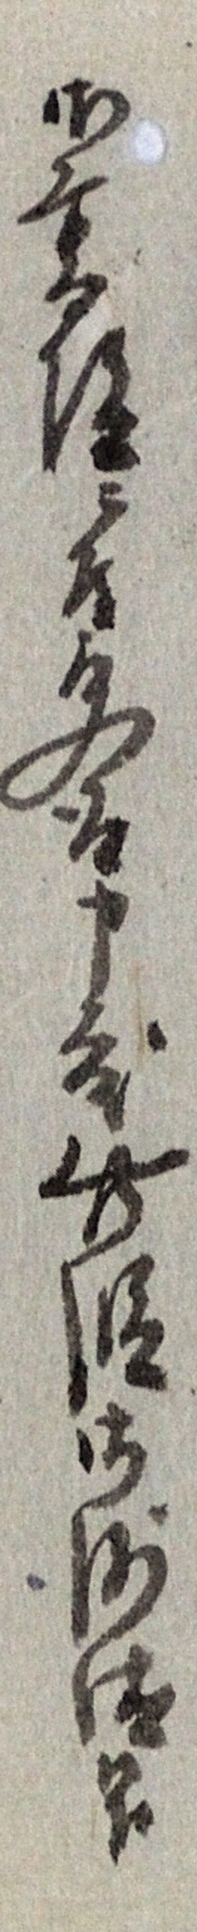御普請ニ付受取申度此段御沙汰被下
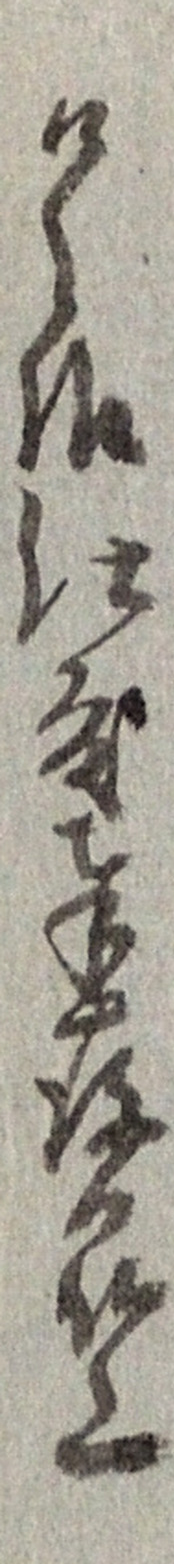候之様仕度奉存候以上
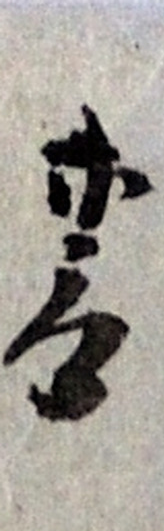廿三日
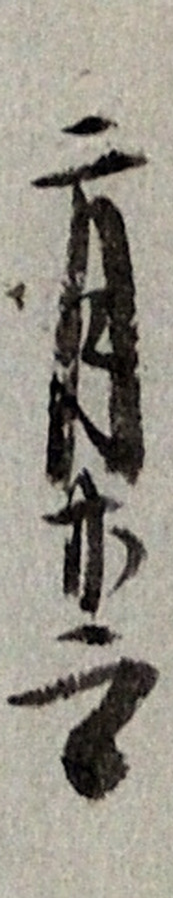二月廿二日
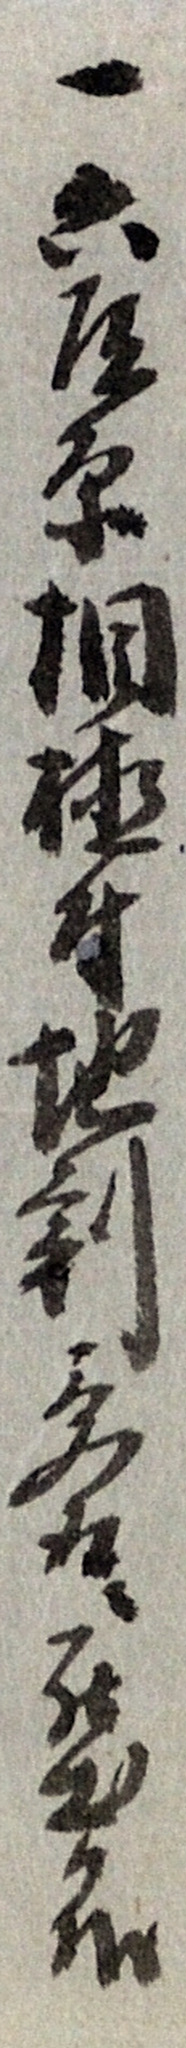一六道原桐植付地割受取ニ罷出候様
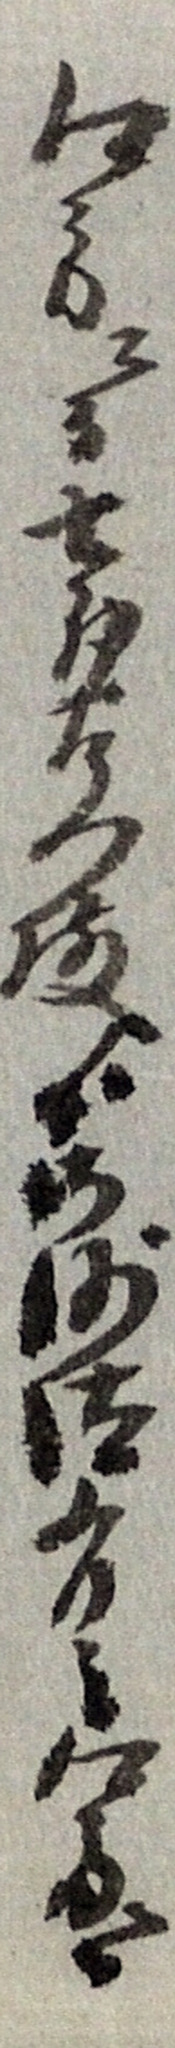郷方ニ而七郎右衛門殿ゟ御沙汰有之郷方ニ而
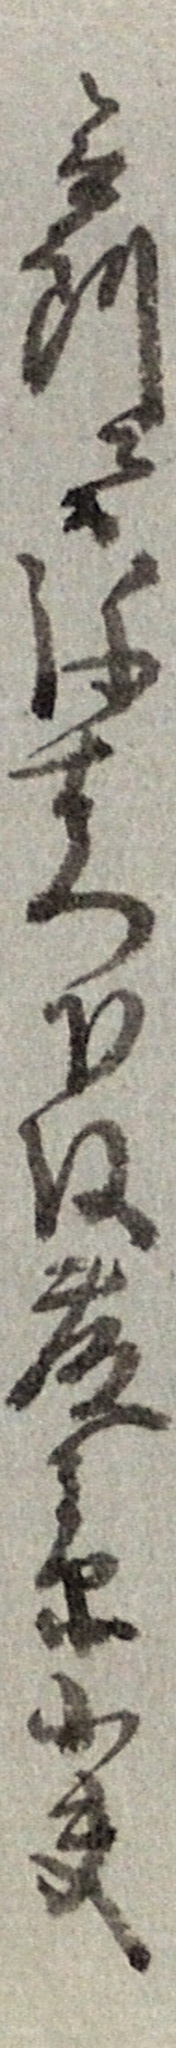会所ニ而弥右衛門下役藤兵衛小夫
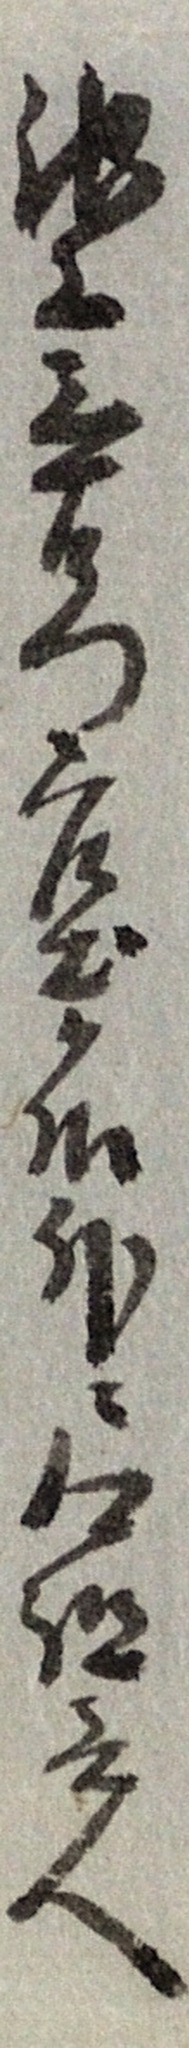池上三右衛門差出候様外ニ郷組壱人
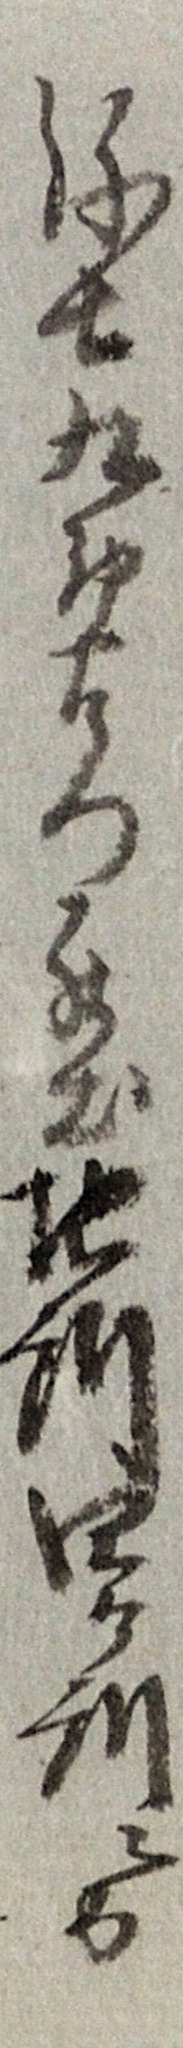弥七九郎右衛門罷出地所四ケ所ニ而
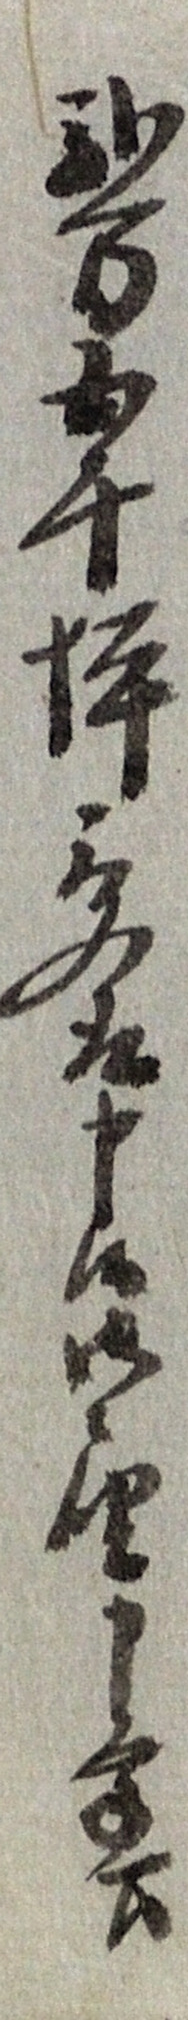弐万五千坪受取申候由届申置候
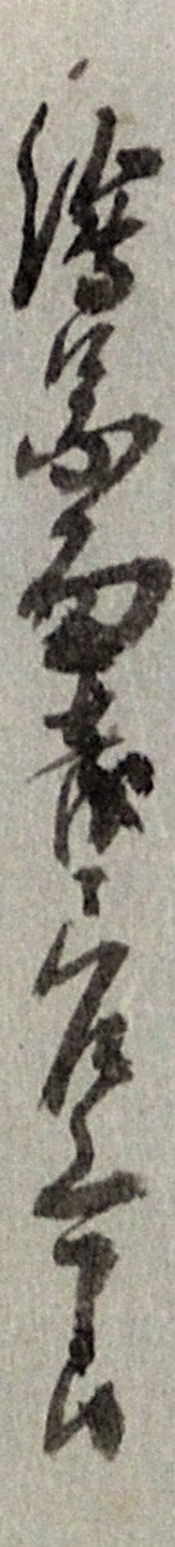絵図面茂差上申候
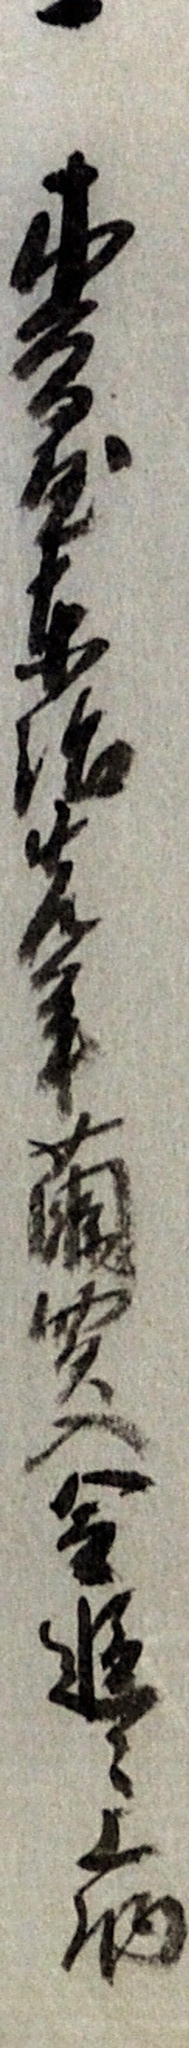一木曽屋東治先年繭買入金追々上納
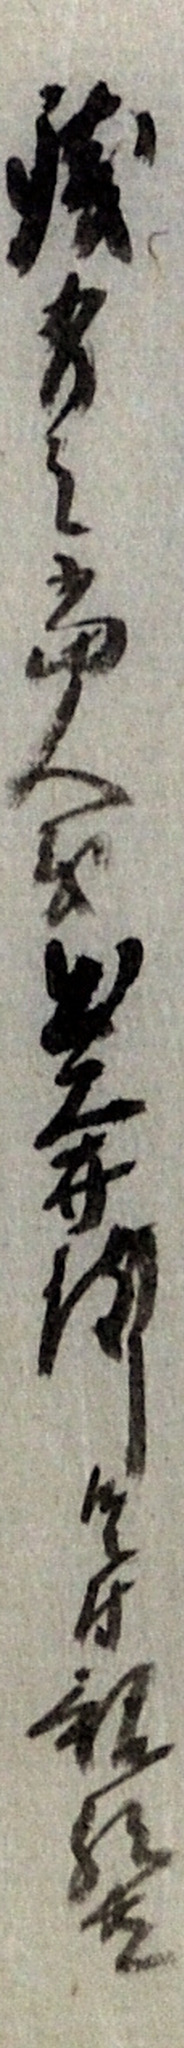残有之当人義出奔致し候ニ付親類共
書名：諸事御用留
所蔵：伊那市立高遠町図書館・合同会社AMANE
